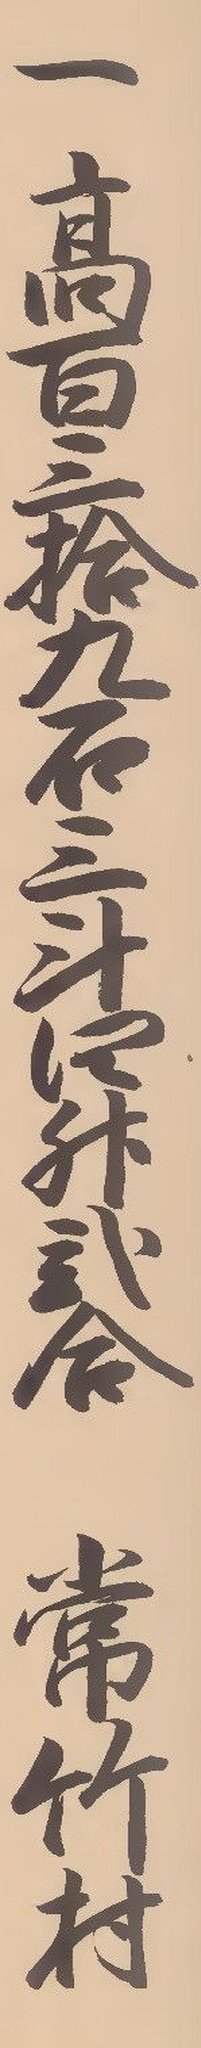一高百三拾九石三斗四升弐合常竹村
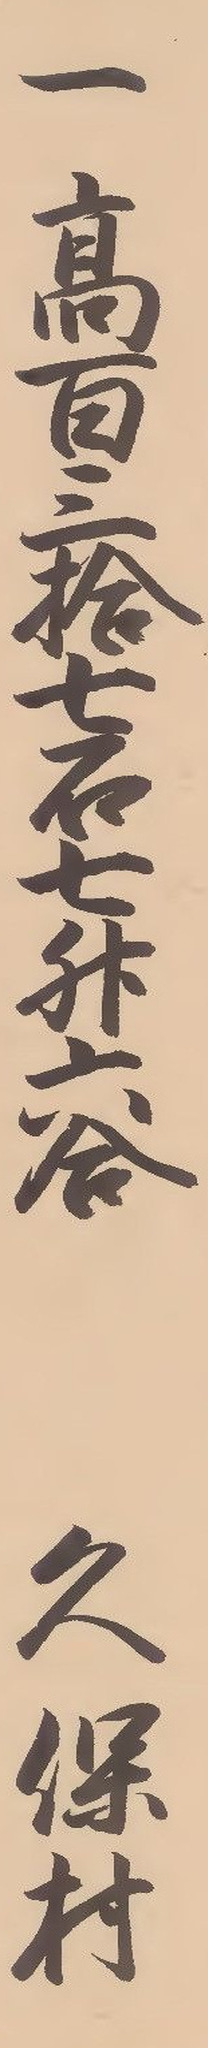一高百三拾七石七升六合久保村
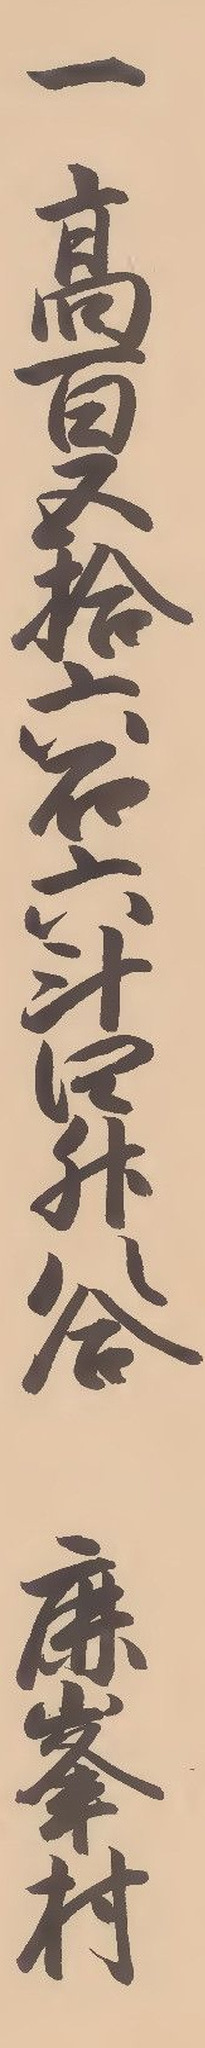一高百五拾六石六斗四升八合鹿峰村
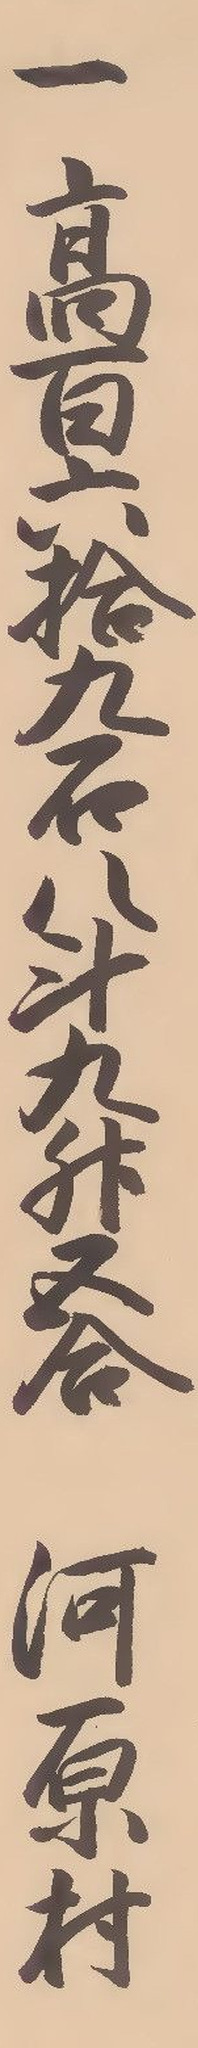一高百六拾九石八斗九升五合河原村

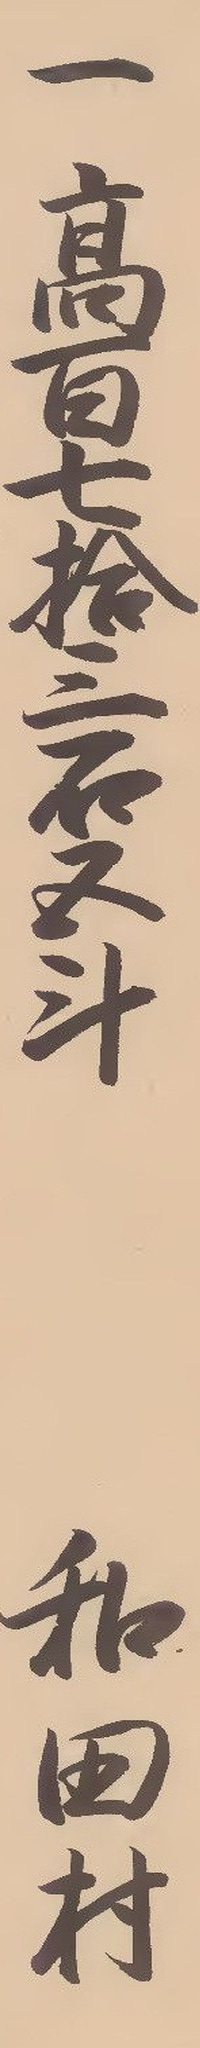一高百七拾三石五斗和田村
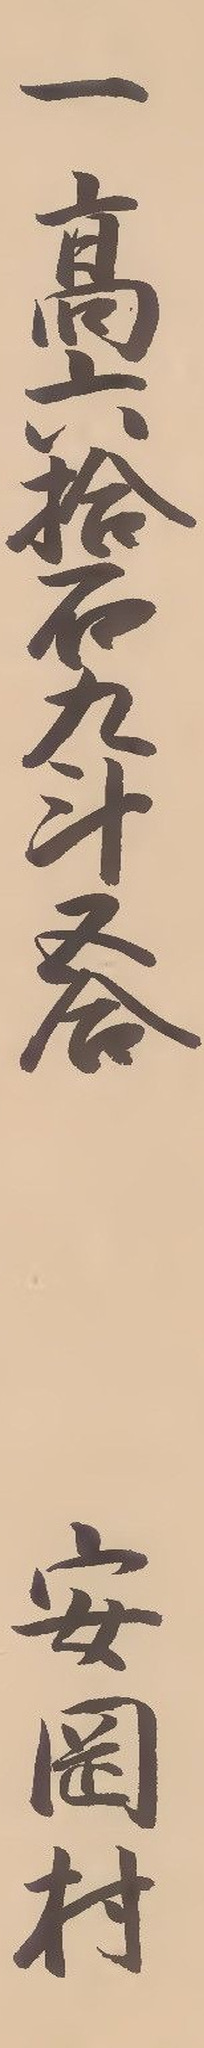一高六拾石九斗五合安岡村
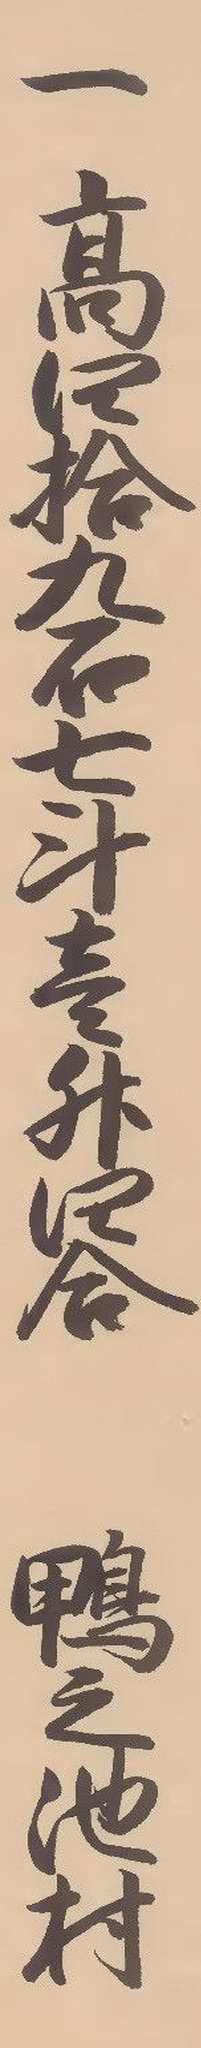一高四拾九石七斗壱升四合鴨之池村
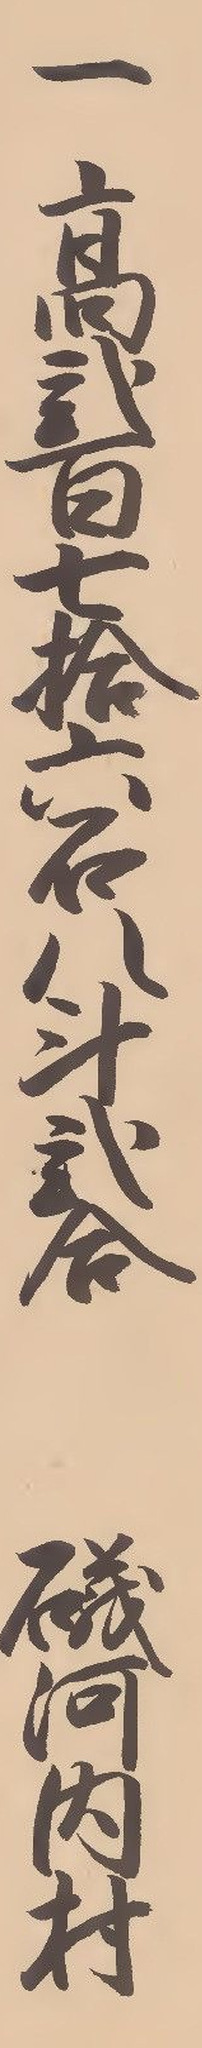一高弐百七拾六石八斗弐合磯河内村
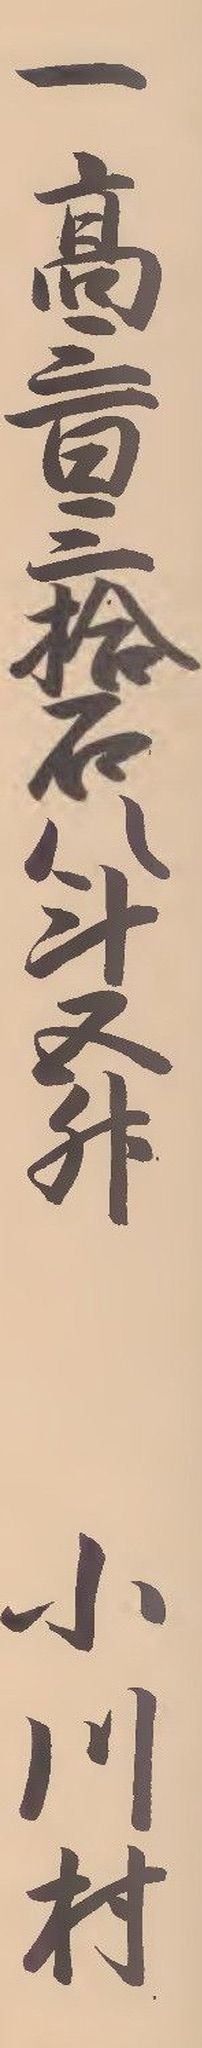一高三百三拾石八斗五升小川村
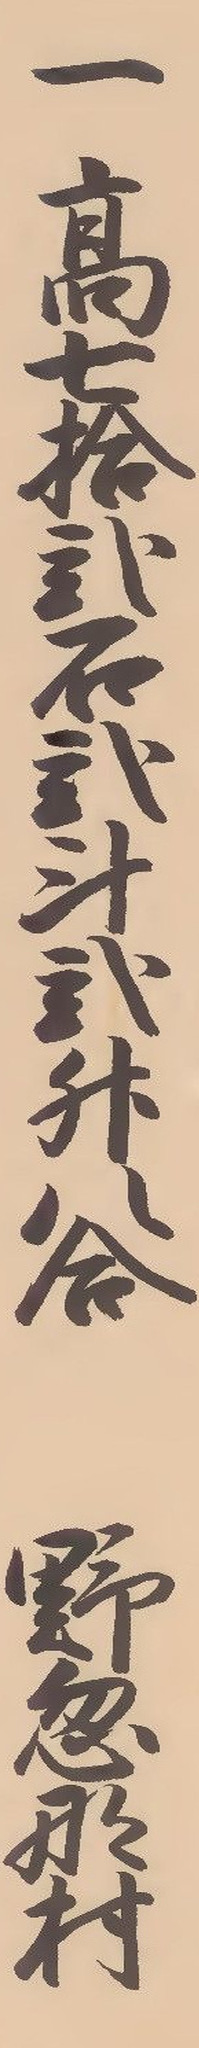一高七拾弐石弐斗弐升八合野忽那村
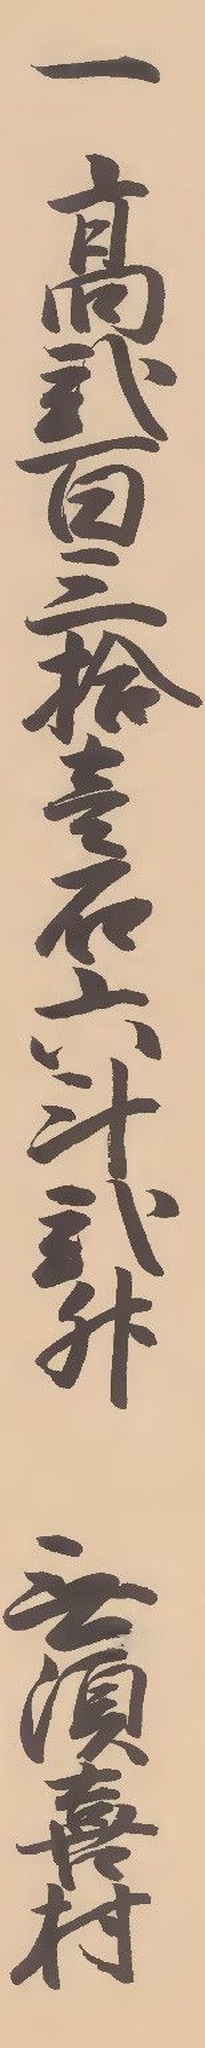一高弐百三拾壱石六斗弐升無須喜村

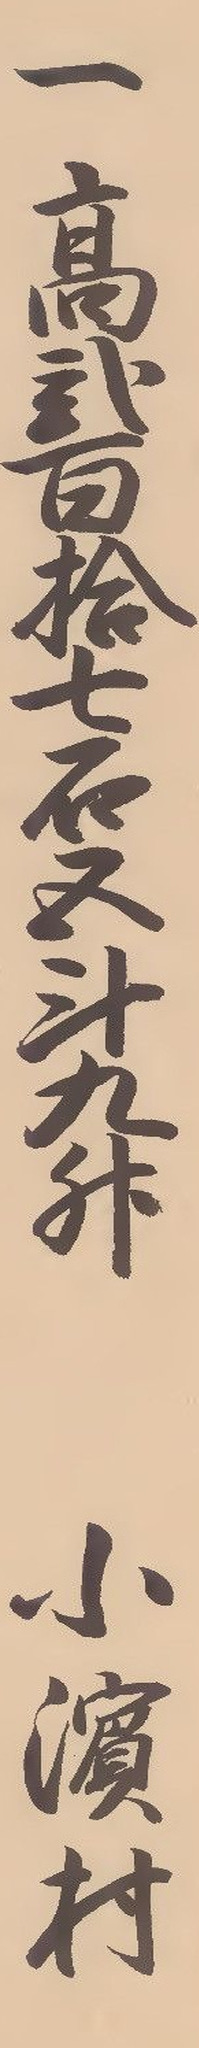一高弐百拾七石五斗九升小浜村
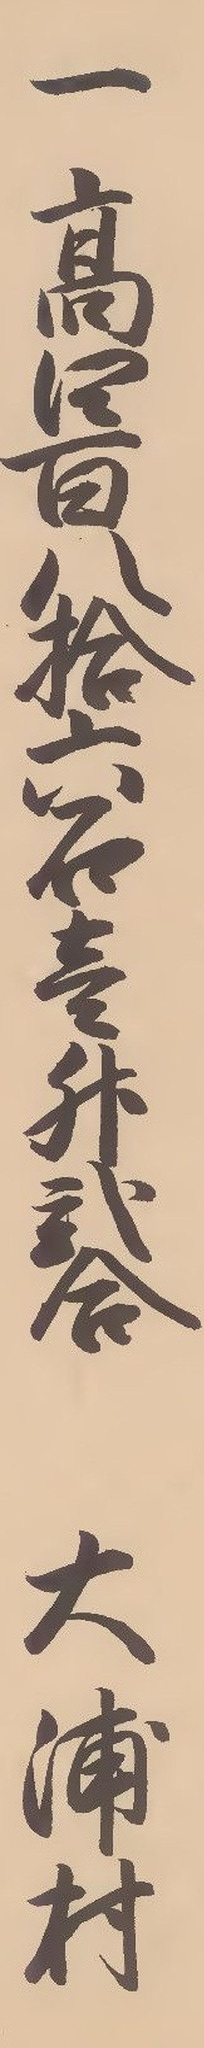一高四百八拾六石壱升弐合大浦村
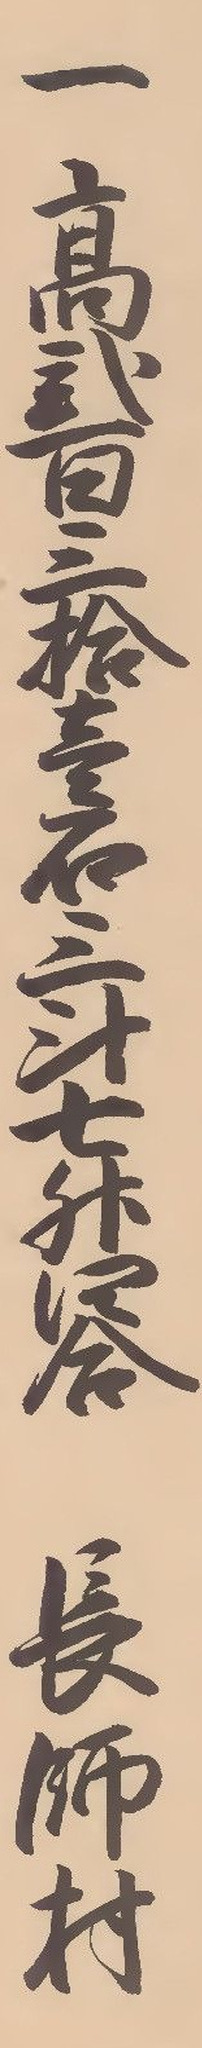一高弐百三拾壱石三斗七升四合長師村
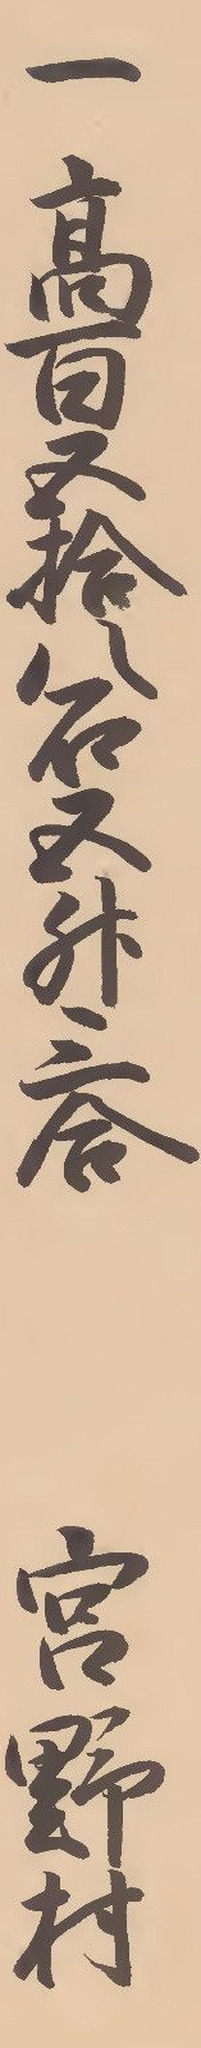一高百五拾八石五升三合宮野村
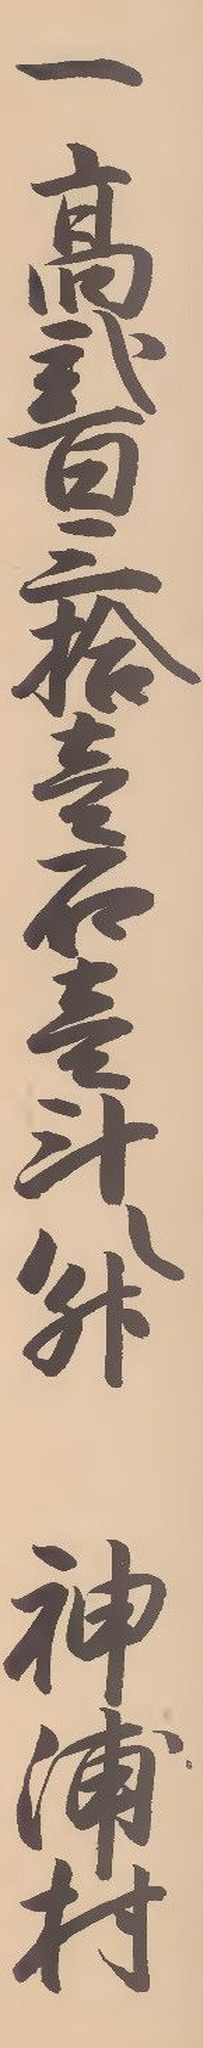一高弐百三拾壱石壱斗八升神浦村
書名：伊予国郷帳
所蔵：国立公文書館 National Archives of Japan
